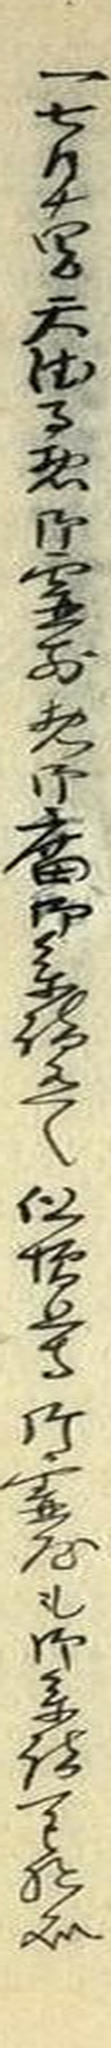一七月十四日天徳寺惣御霊前惣御庿御参詣有之但増上寺御霊屋も御参詣可被遊処
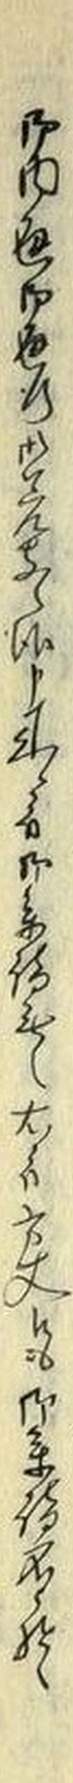御内通御通行御差支候趣申来候ニ付御参詣無之右ニ付方丈江も御参詣不被遊候
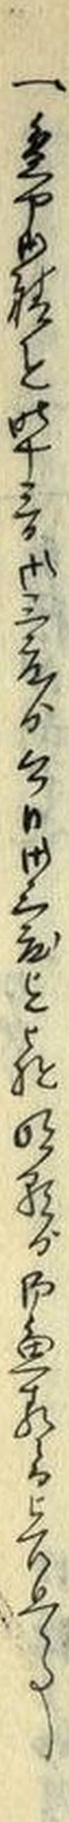一盆中御精進昨十三日御三度ゟ今日御三度迄被遊明朝ゟ御魚類ニ而被召上候事
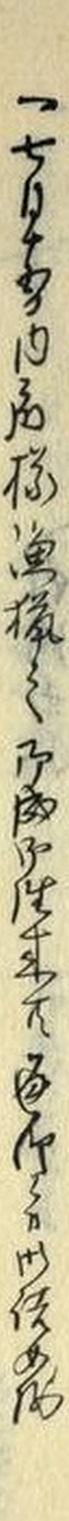一七月十五日内府様漁猟之御成御往来共通御ニ付御詰如例
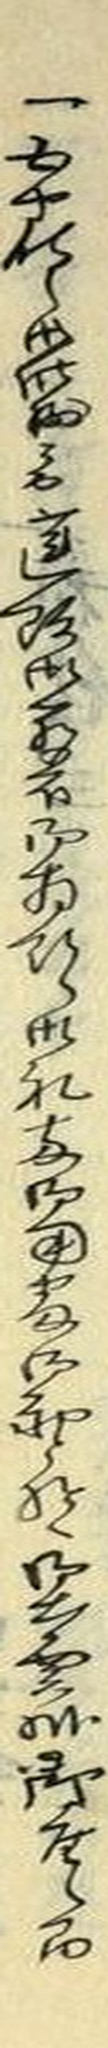一五半時之御供揃ニ而蓮飯御箱肴御拝領之御礼両御用番御勤被遊候御出殿掛御座之間
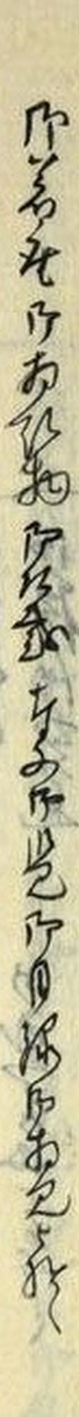御着座御拝領物御頂戴奉文御覧御目録御拝見被遊候
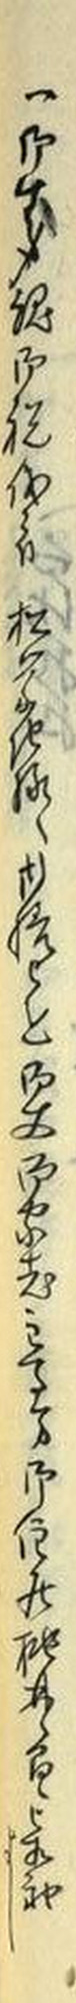一御生身魂御祝儀ニ付松栄院様へ御膳被進御使御家老主馬方御住居桃林之間へ被相勤よし
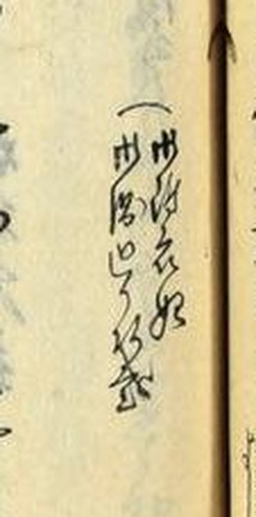御側廻り頂戴
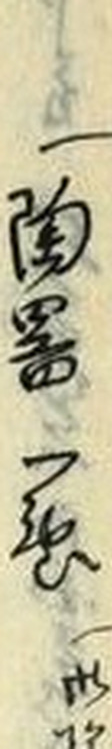陶器一台
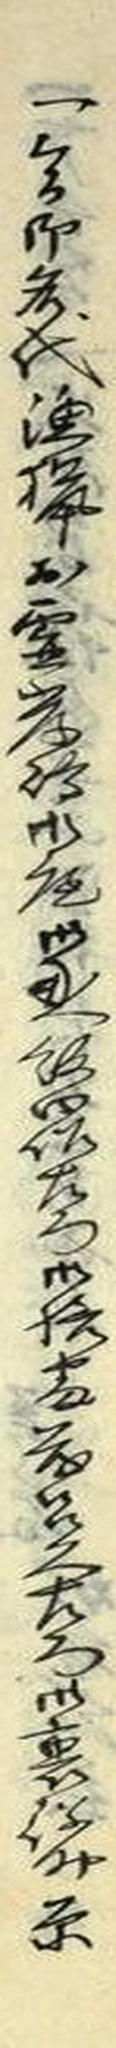一今日御名代漁猟於霊岸嶋御庭御用人飯田作左衛門御膳番茂呂久左衛門御裏役助原
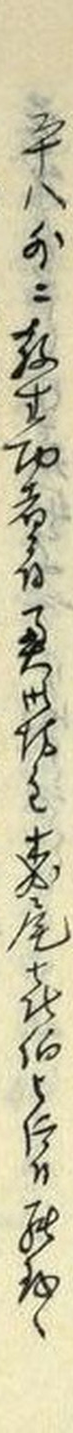平八外ニ殺生巧者ニ付奥御坊主森尾喜伯被仰付罷越候
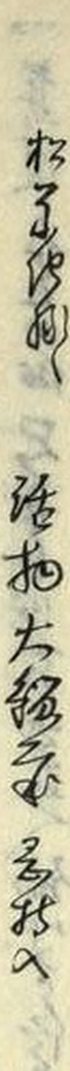松栄院様へ活物大鯔二本岡持入
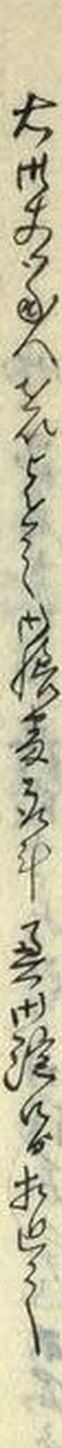右御使御用人を以被進之御膳番取計奥御錠口ゟ相廻之
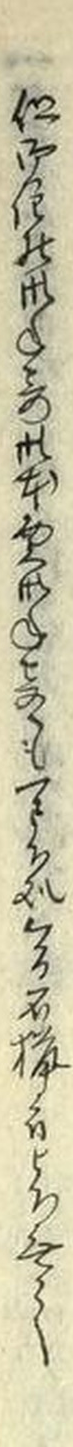但御住居御年寄御本殿御年寄へも可被下処今日不猟ニ付被下無之
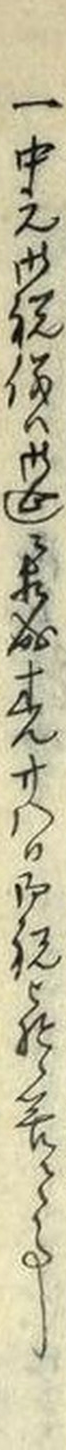一中元御祝儀ハ御延ニ相成来ル廿八日御祝被遊候筈ニ候事
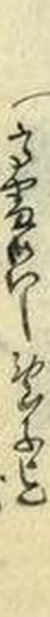当番御いし台子迄
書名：少傅日録抄（斉善付側向頭取日記、在府）
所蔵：福井県文書館 Fukui Prefectural Archives
